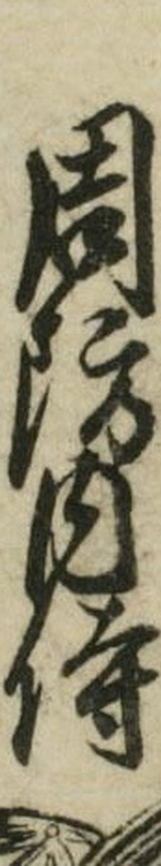周防内侍
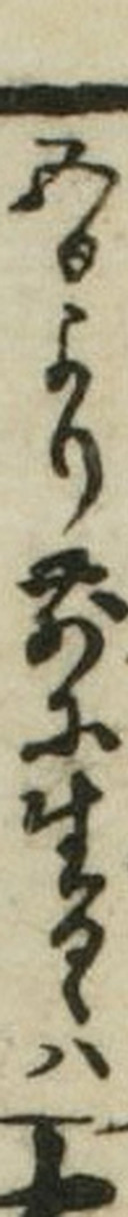五日より前に生るゝは
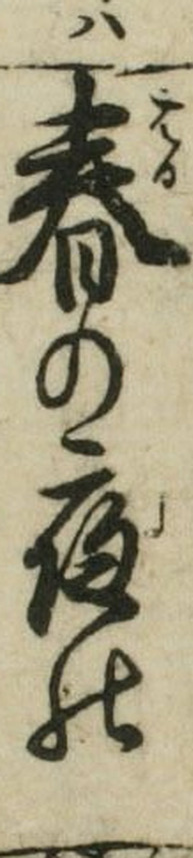春の夜の
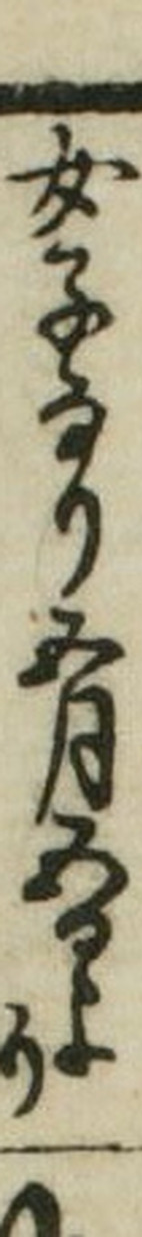女子なり五月五日より
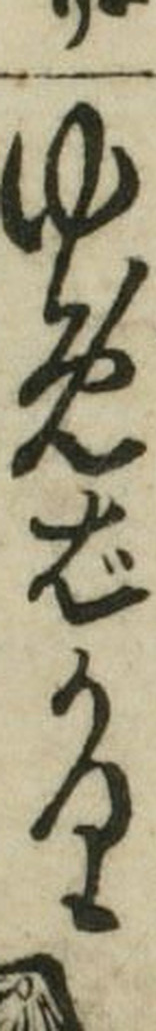ゆめばかり
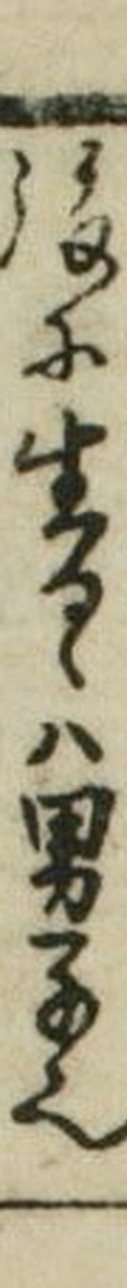後に生るゝは男子也
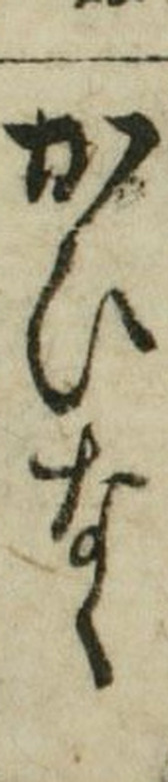かひなく
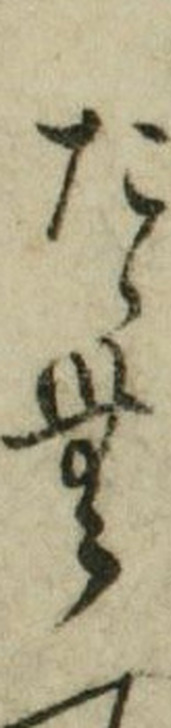たゝむ
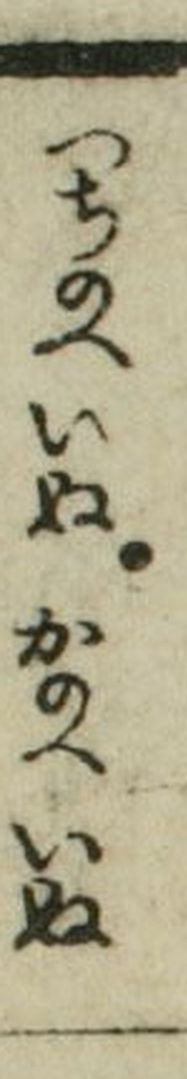つちのへいぬ●かのへいぬ
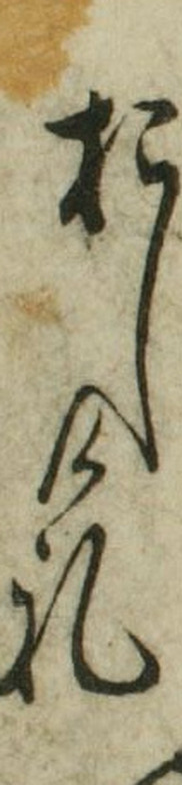おしけれ

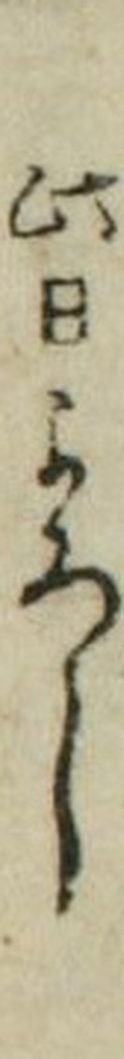此日よろし
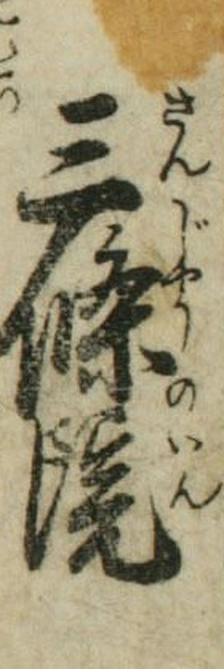三条院
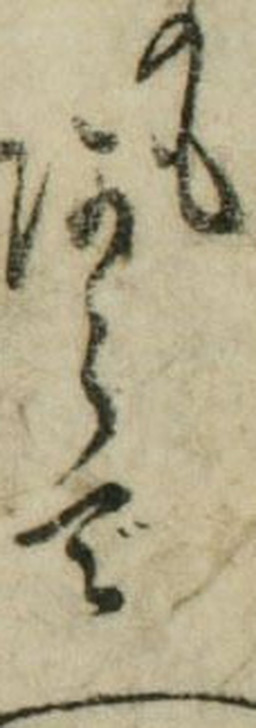あらで
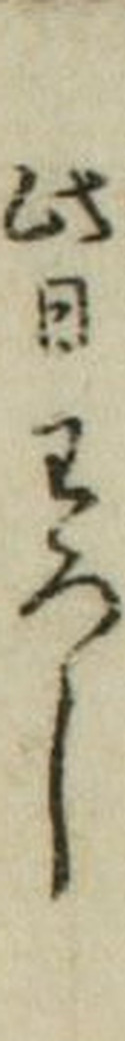此日よろし
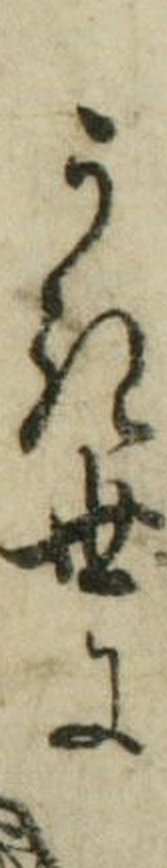うき世に
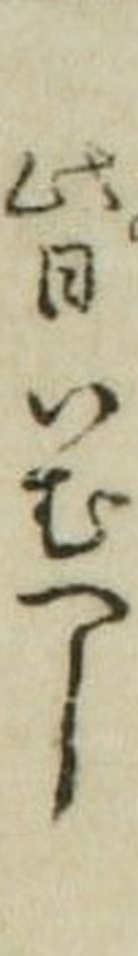此日いむへし
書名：百人一首
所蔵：東京学芸大学教育コンテンツアーカイブ
